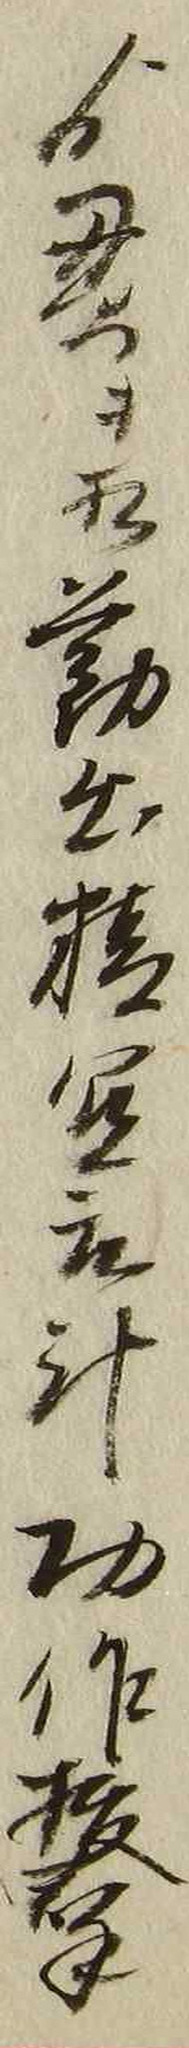ゟ貫キ相勤出精宜取計功作抜群
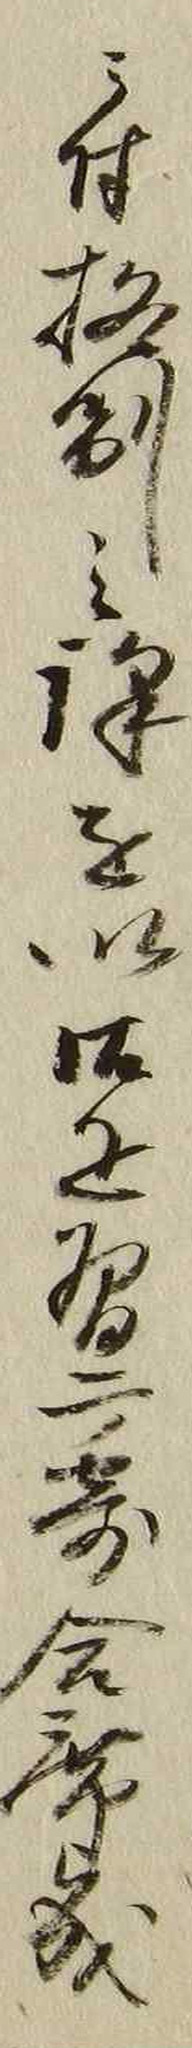ニ付格別之訳を以御近習二ノ寄合席被成
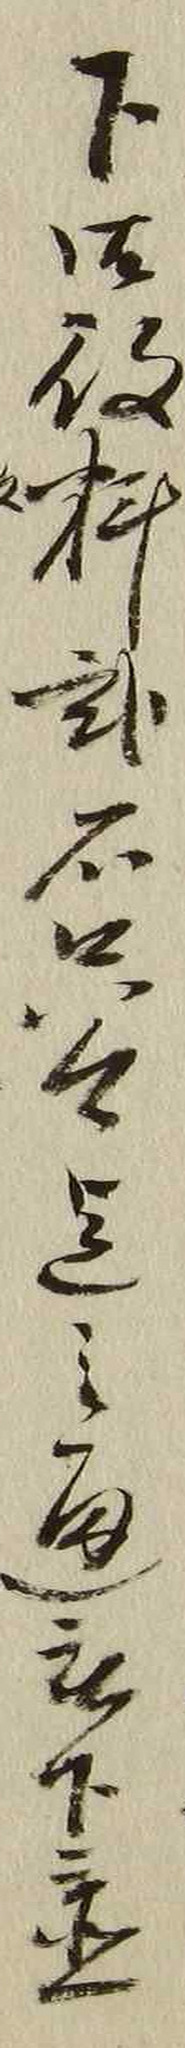下御役料弐石只今迄之通被下置
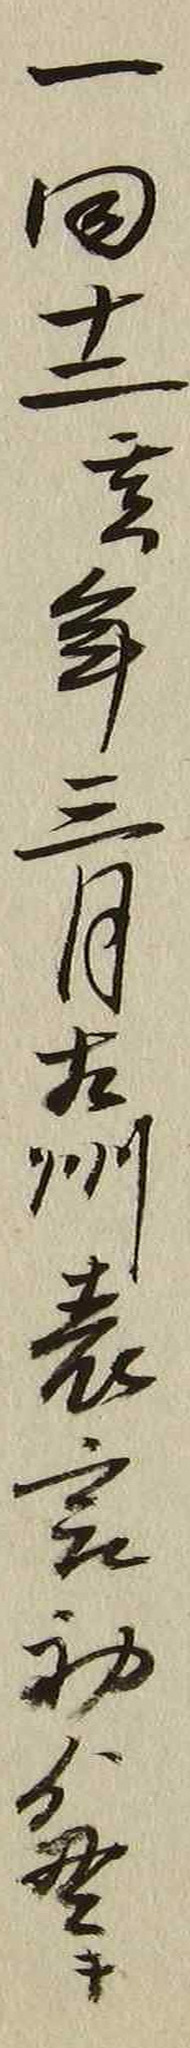一同十二亥年三月相州表最初ゟ貫キ
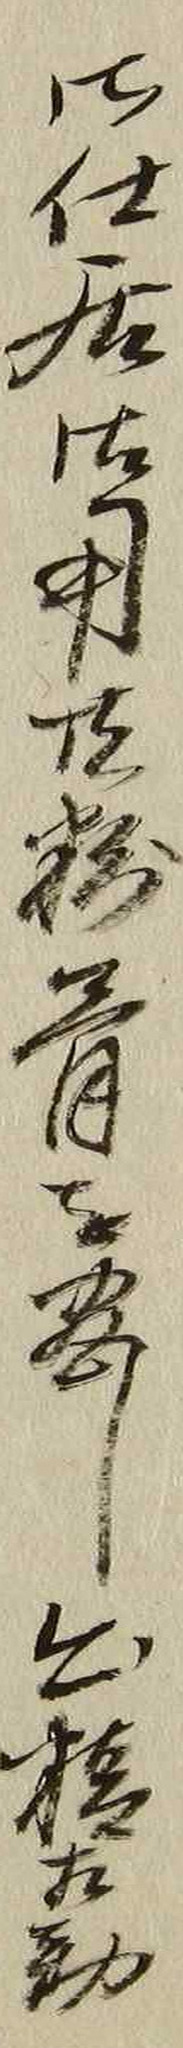御仕居御用共粉骨を尽し出精相勤
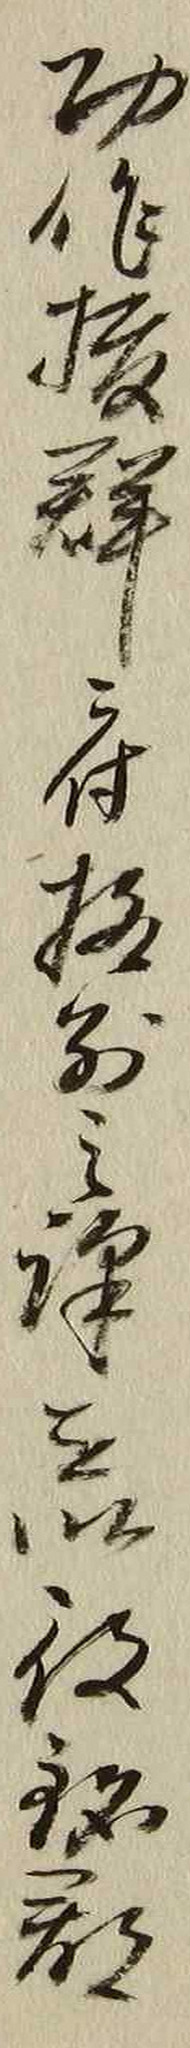功作抜群ニ付格別之訳を以役銘郡
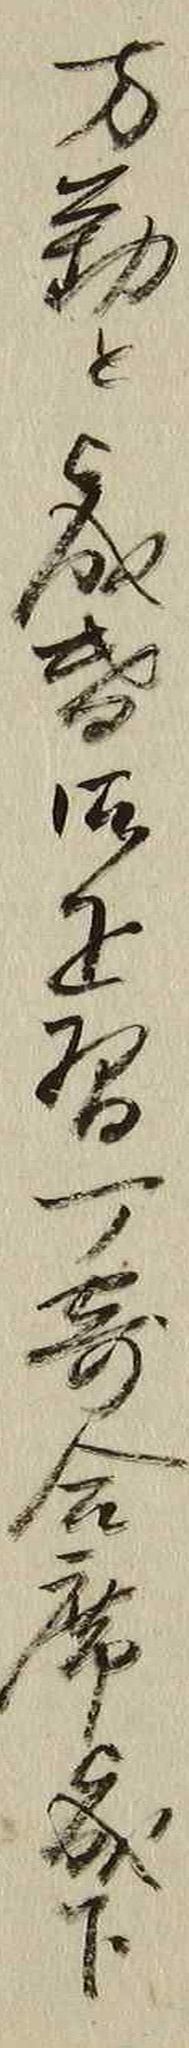方勤と被成替御近習一ノ寄合席被成下
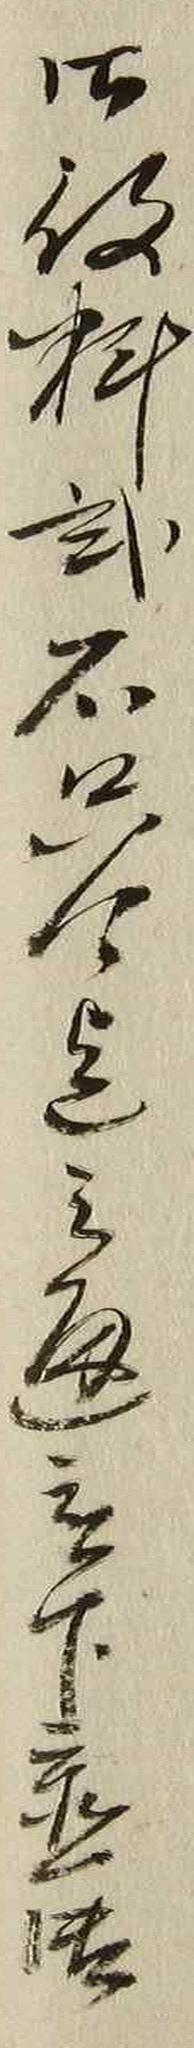御役料弐石只今迄之通被下置御
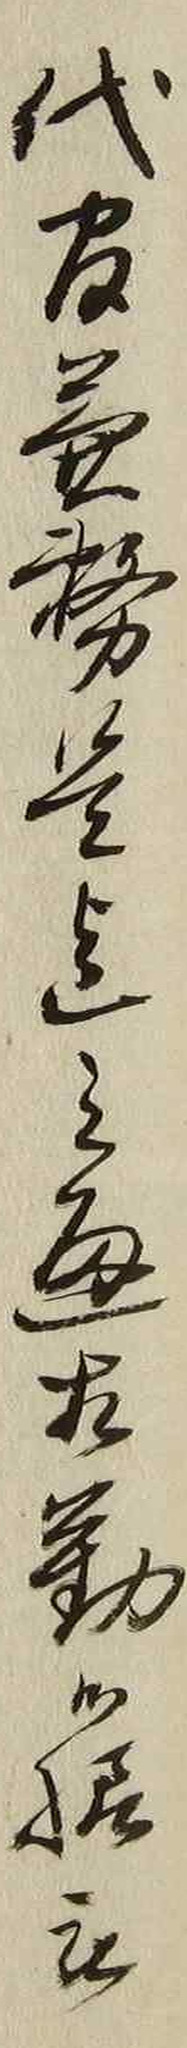代官兼務是迄之通相勤候様被
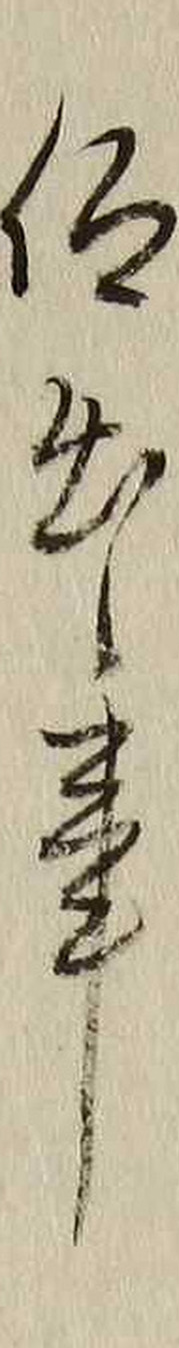仰出候事
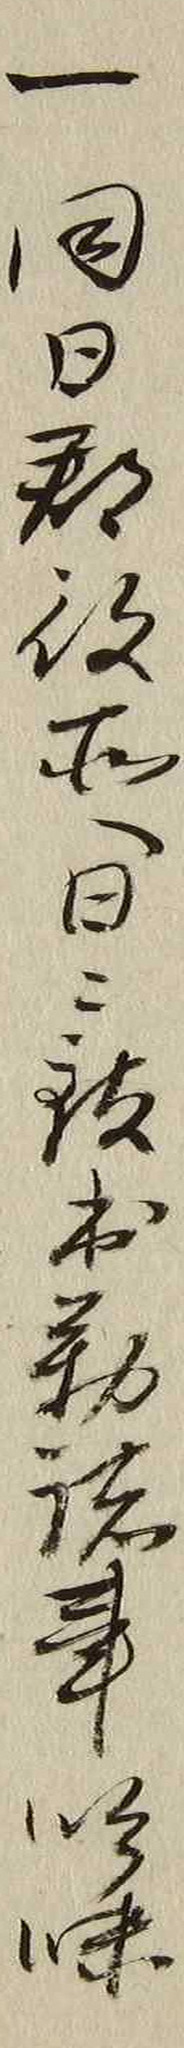一同日郡役所へ日々致出勤諸事吟味
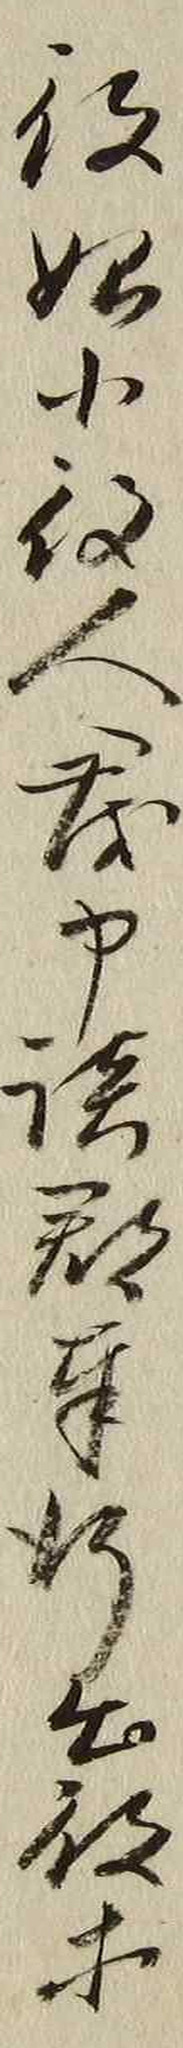役始小役人へも申談郡奉行出役等
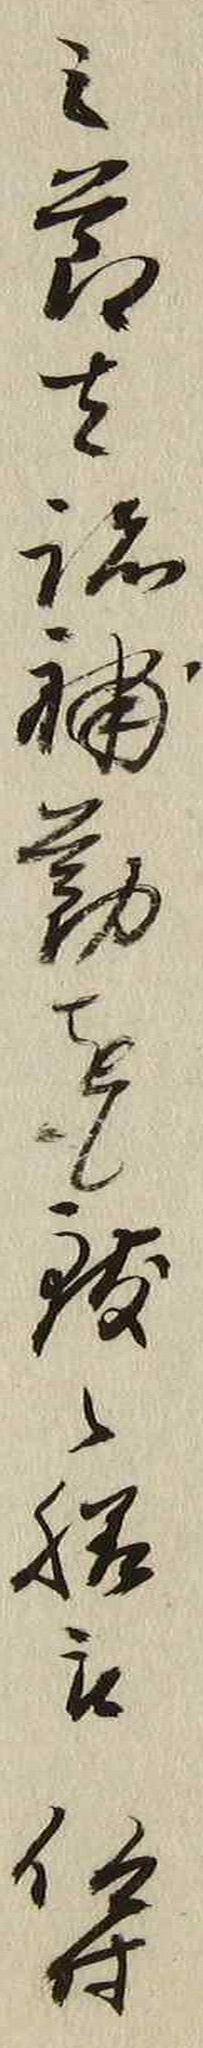之節は諸補勤をも致候様被仰付
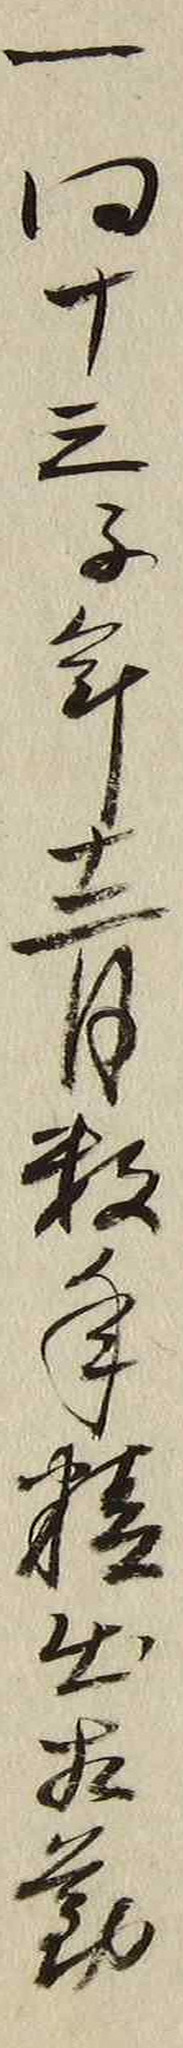一同十三子年十二月数年精出相勤
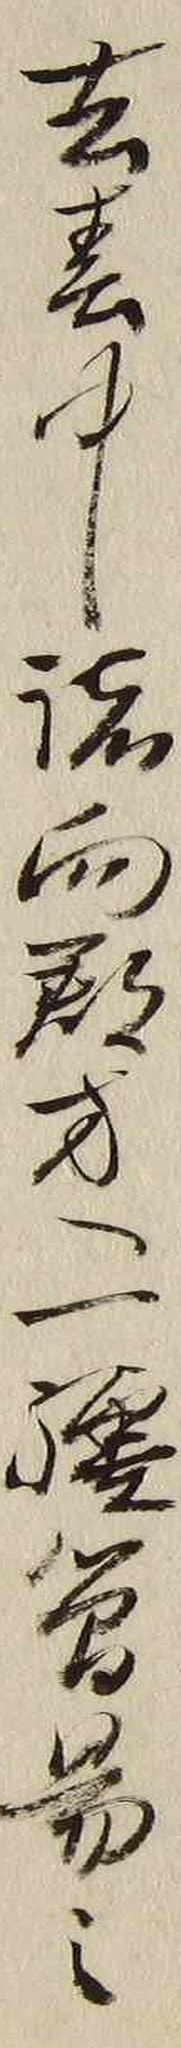去春中諸向郡方へ一纏簡易之
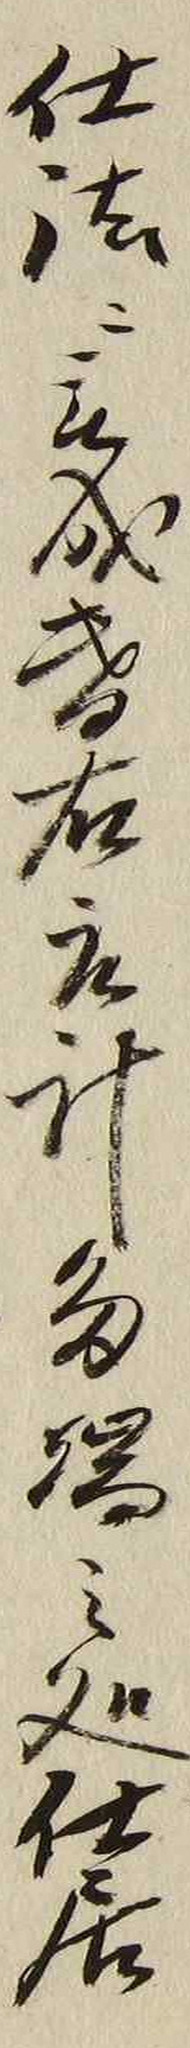仕法ニ被成替右取計多端之処仕居
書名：諸士系譜　巻之352　す之部2
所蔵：会津若松市立会津図書館
